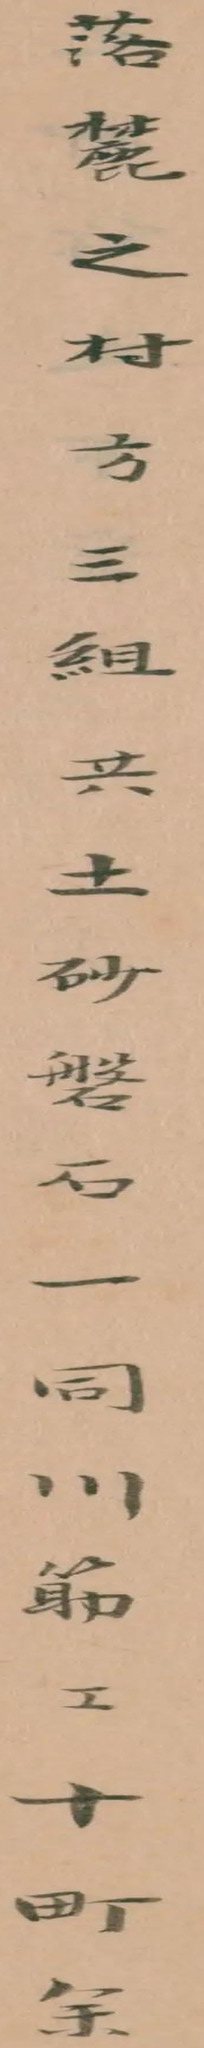落麓之村方三組共土砂磐石一同川筋エ十町余
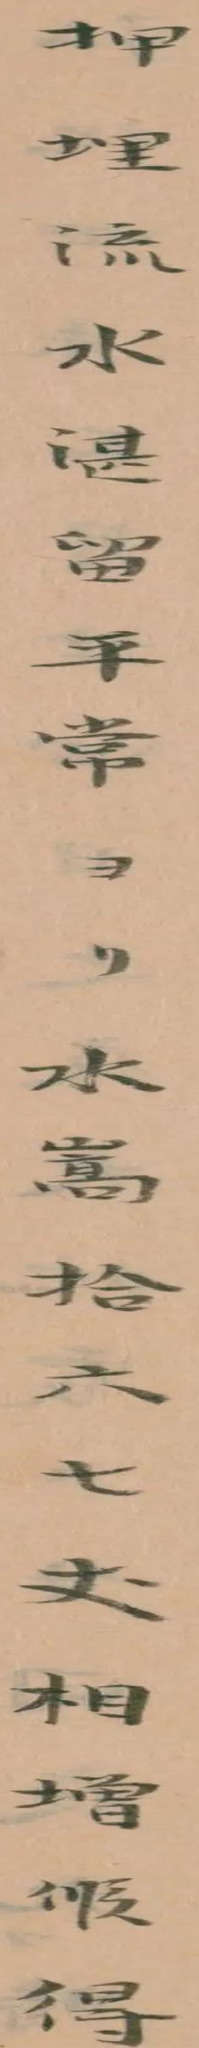押埋流水湛留平常ヨリ水嵩拾六七丈相増候得
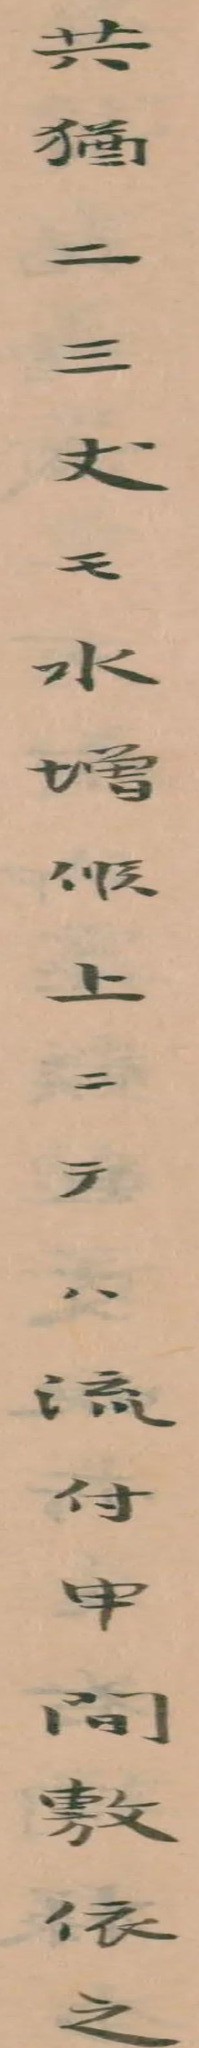共猶二三丈モ水増候上ニテハ流付申間敷依之
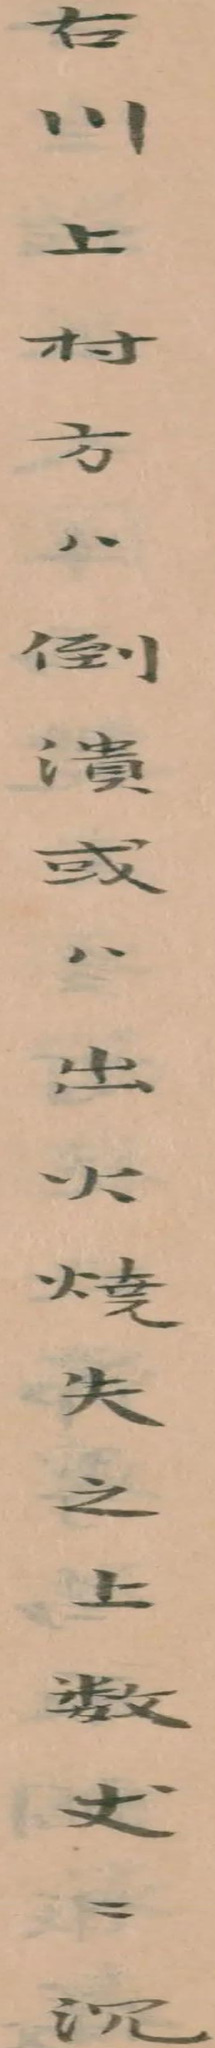右川上村方ハ倒潰或ハ出火焼失之上数丈ニ沈
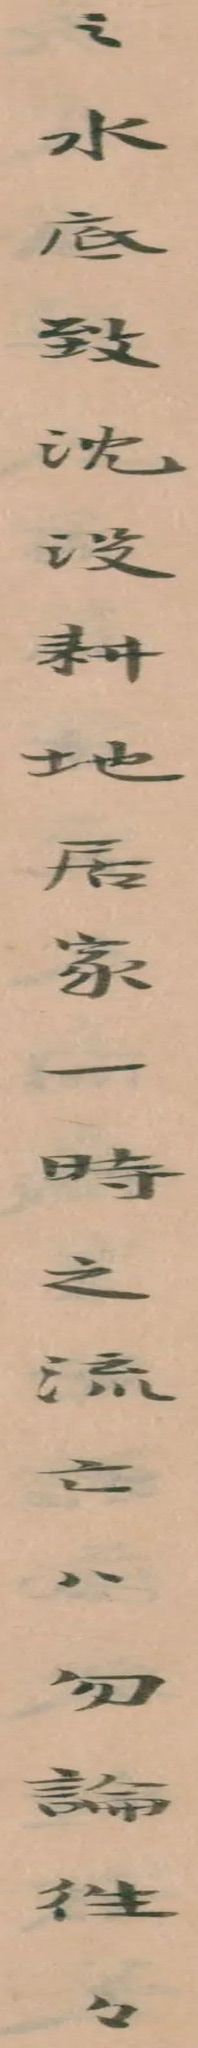ミ水底致沈没耕地居家一時之流亡ハ勿論往々
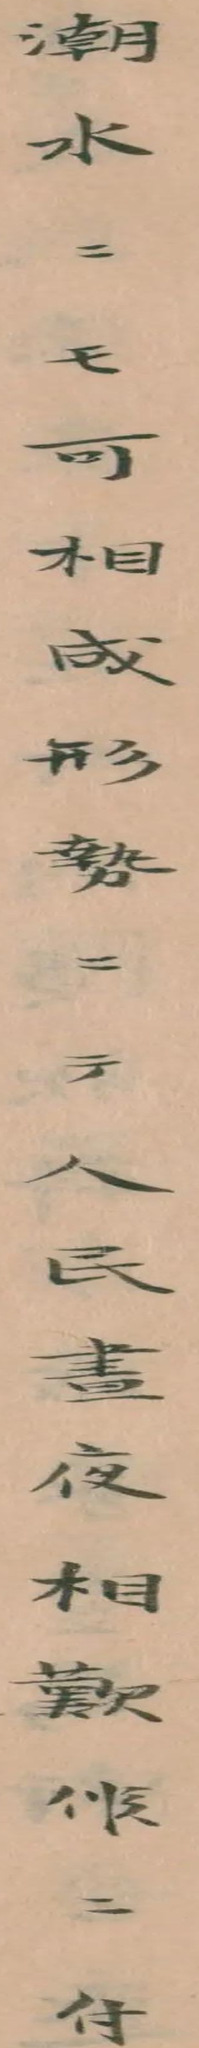潮水ニモ可相成形勢ニテ人民昼夜相歎候ニ付
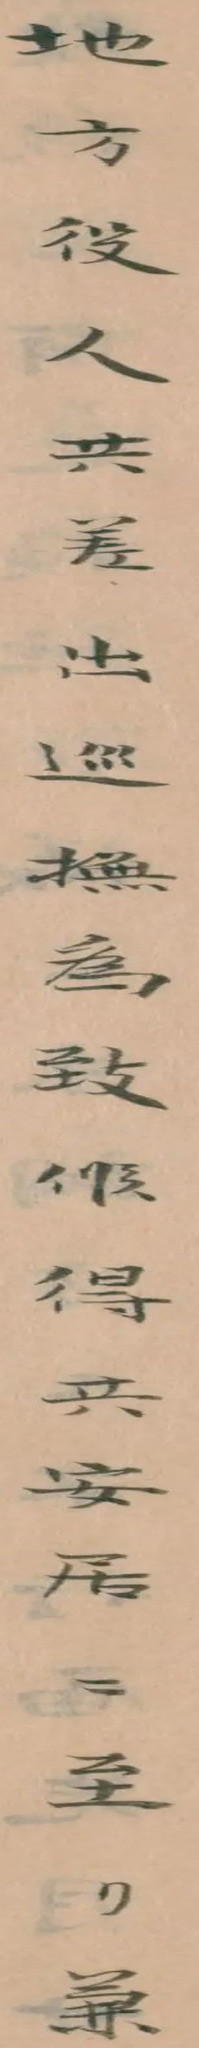地方役人共差出巡撫為致候得共安居ニ至リ兼
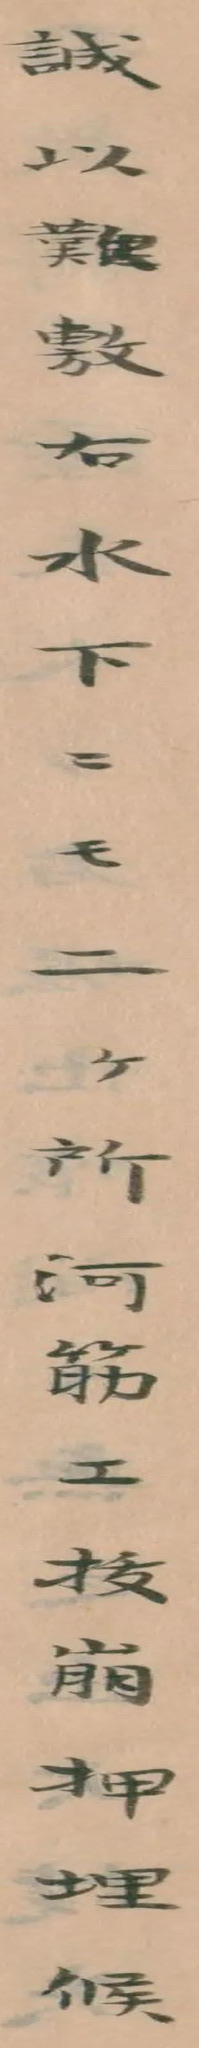誠以歎敷右水下ニモ二ケ所河筋エ抜崩押埋候
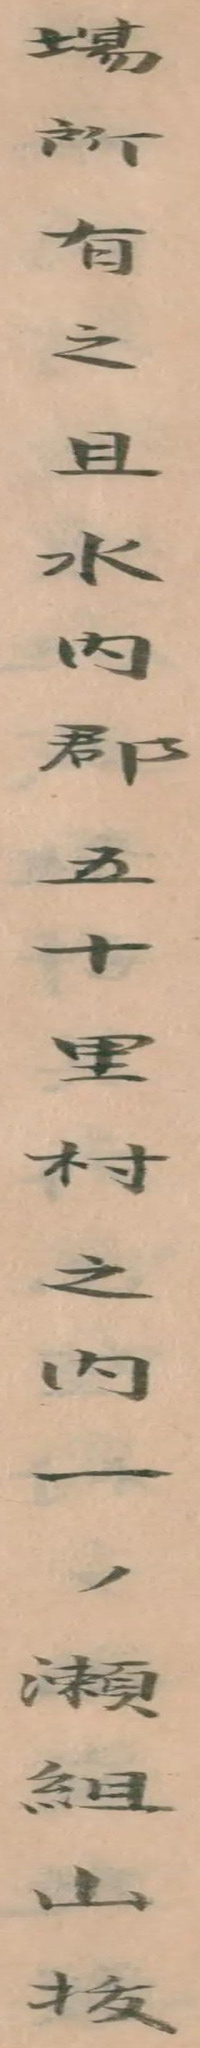場所有之且水内郡五十里村之内一ノ瀬組山抜
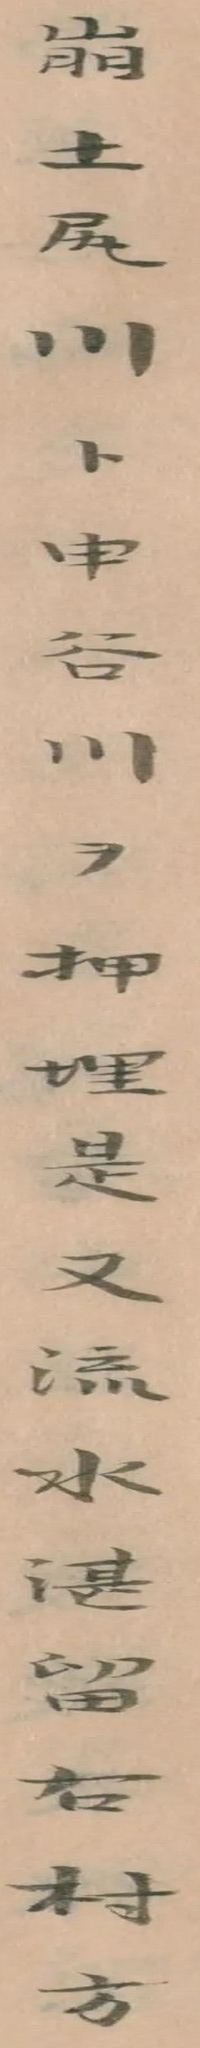崩土尻川ト申谷川ヲ押埋是又流水湛留右村方
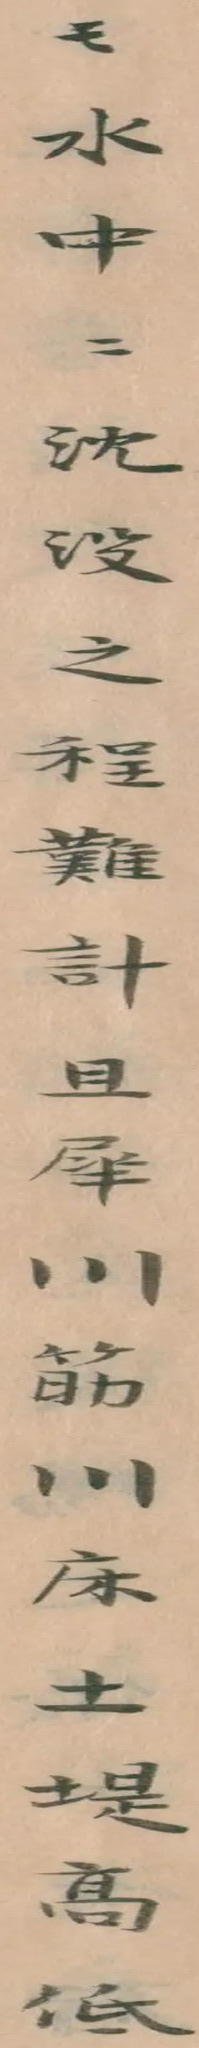モ水中ニ沈没之程難計且犀川筋川床土堤高低
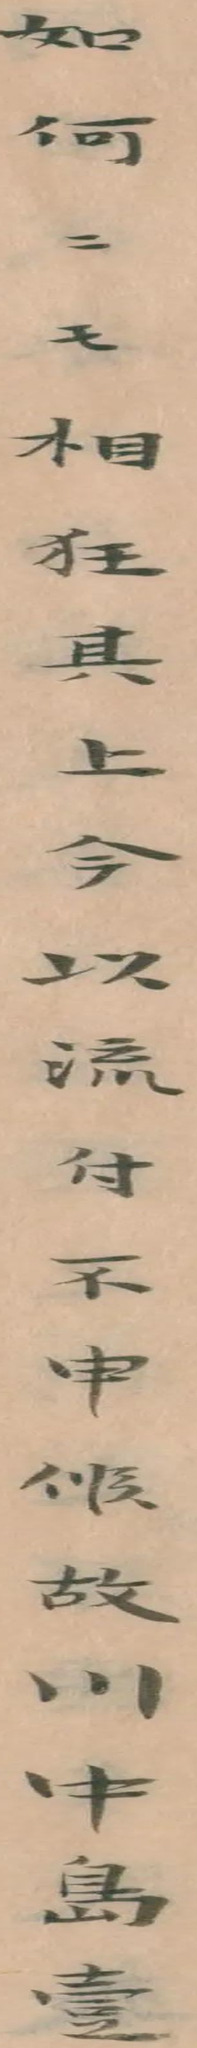如何ニモ相狂其上今以流付不申候故川中島壹

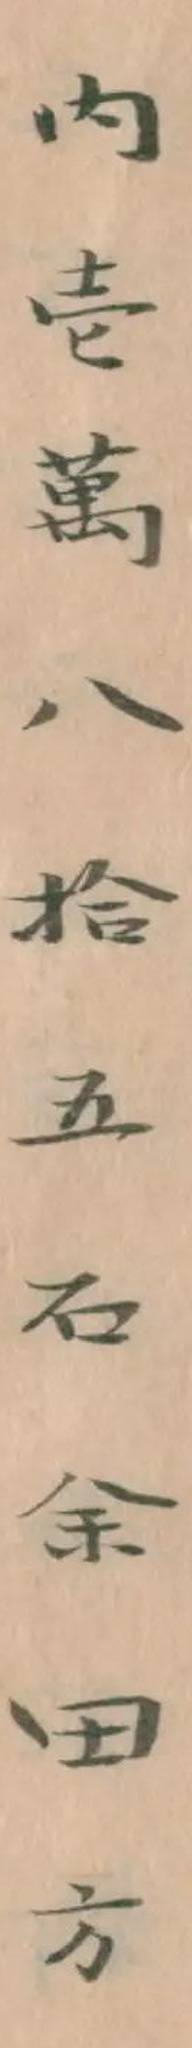内壱萬八拾五石余田方
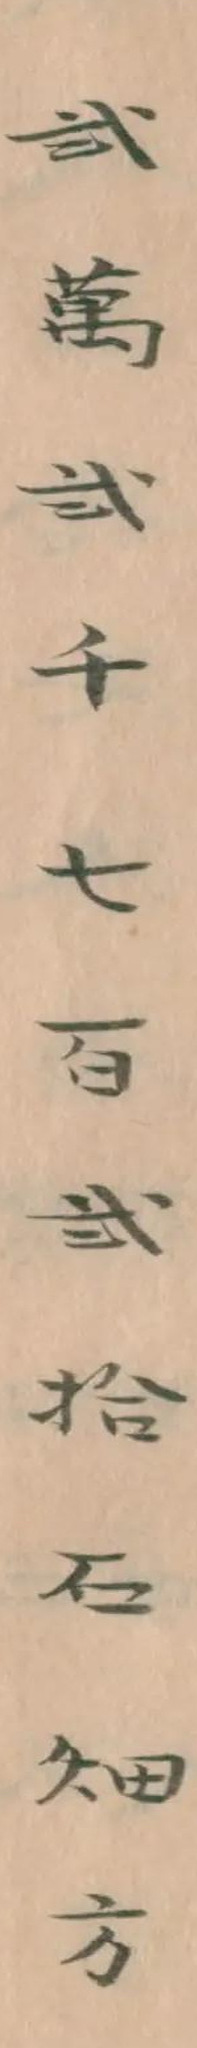弐萬弐千七百弐拾石畑方
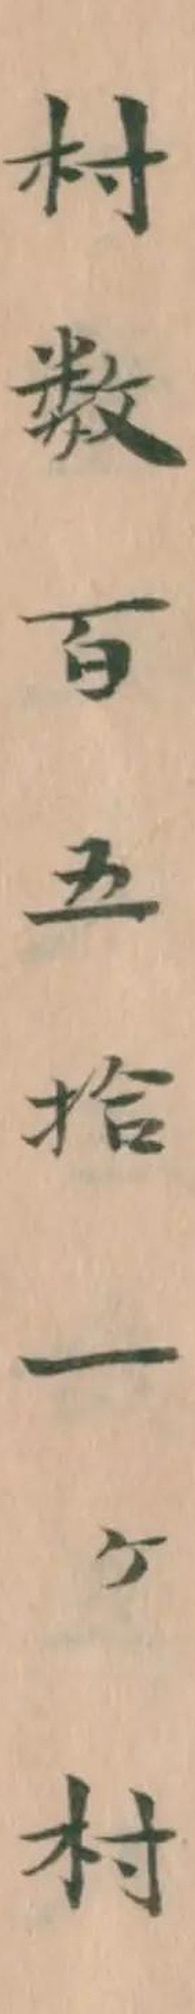村数百五拾一ケ村
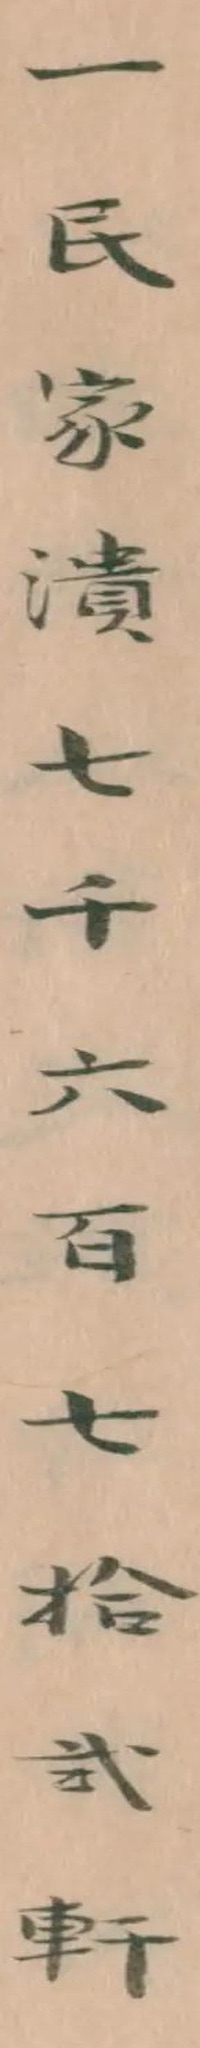一民家潰七千六百七拾弐軒
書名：地災撮要. 巻5-6(地震之部)
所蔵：国立国会図書館 National Diet Library, JAPAN
